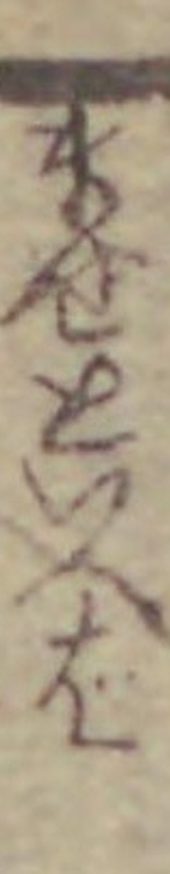ませといへば
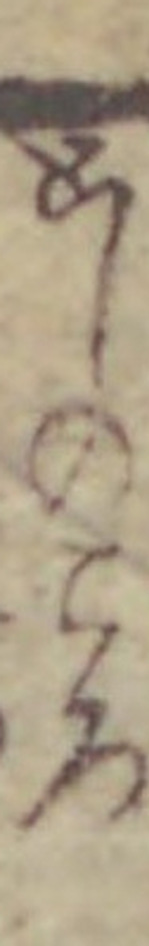としのころ
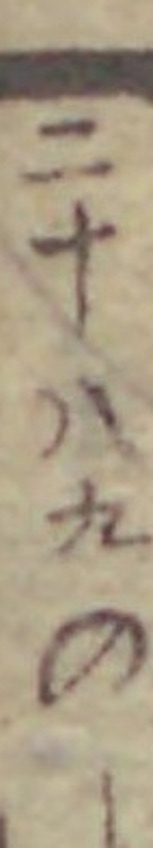二十八九の
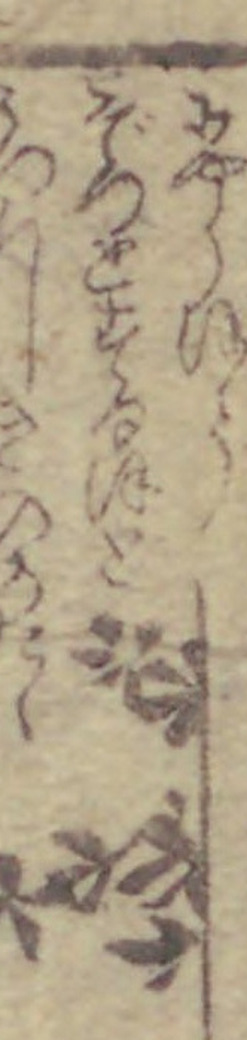ぞつとするほと
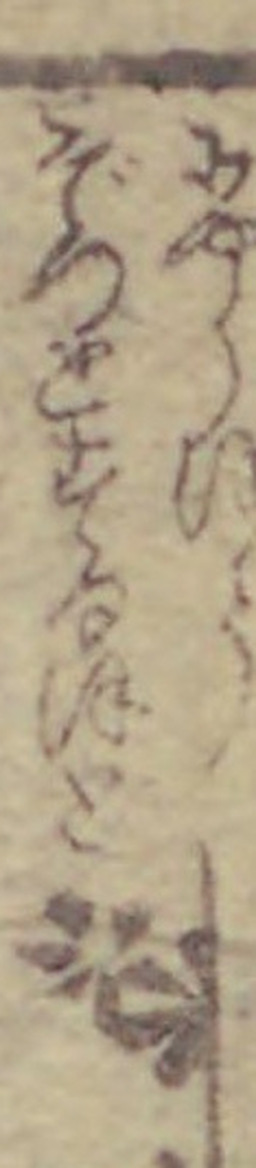ぞつとするほと
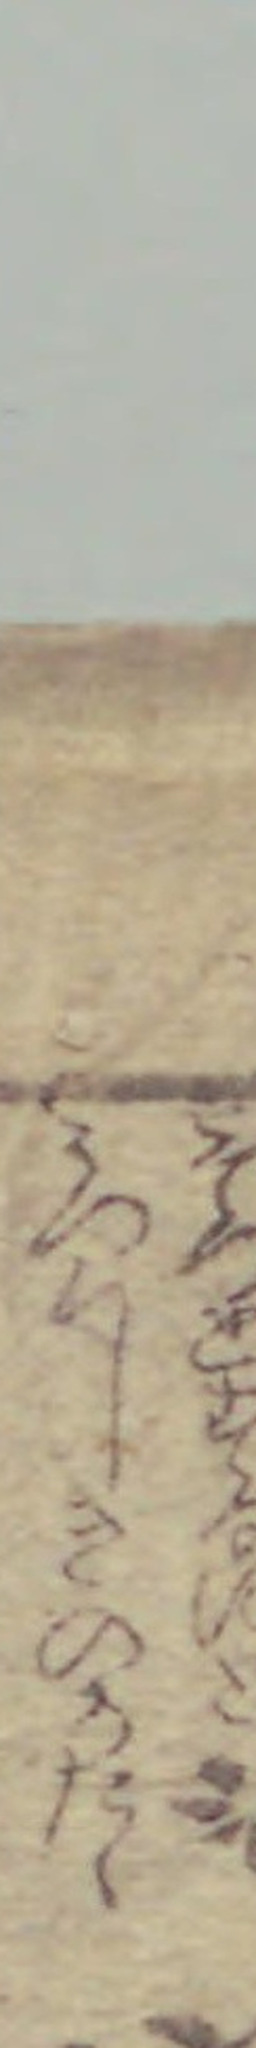うつくしきのかたゝ
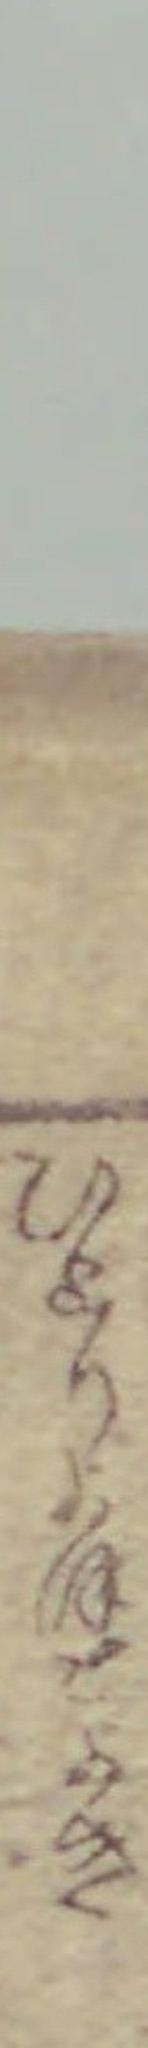ひとりよほとよき
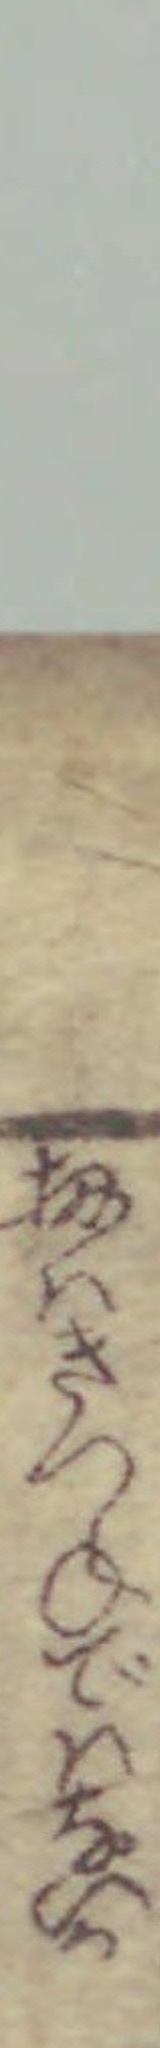扨はきつねではないか
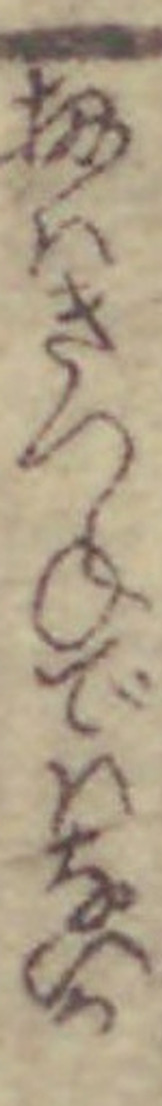扨はきつねではないか
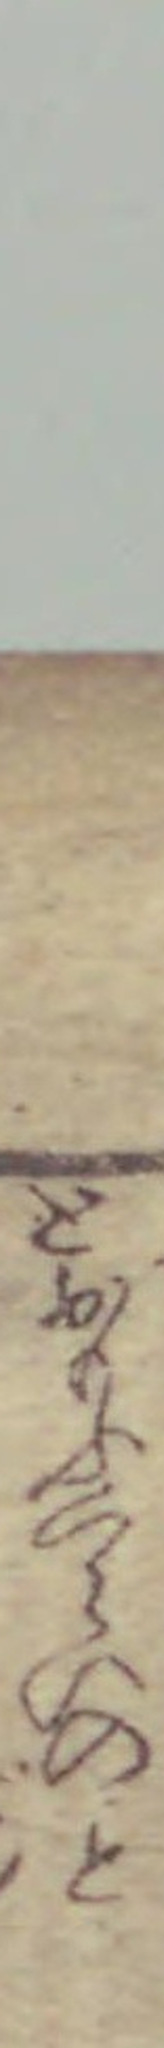とおもふくらいのと
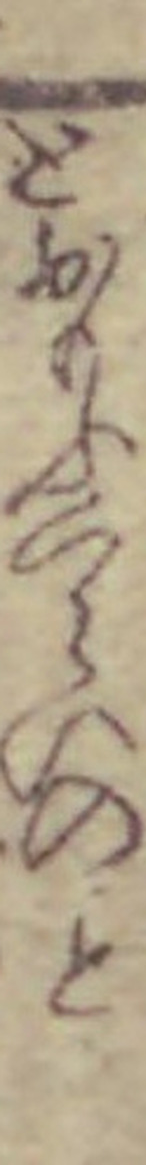とおもふくらいのと
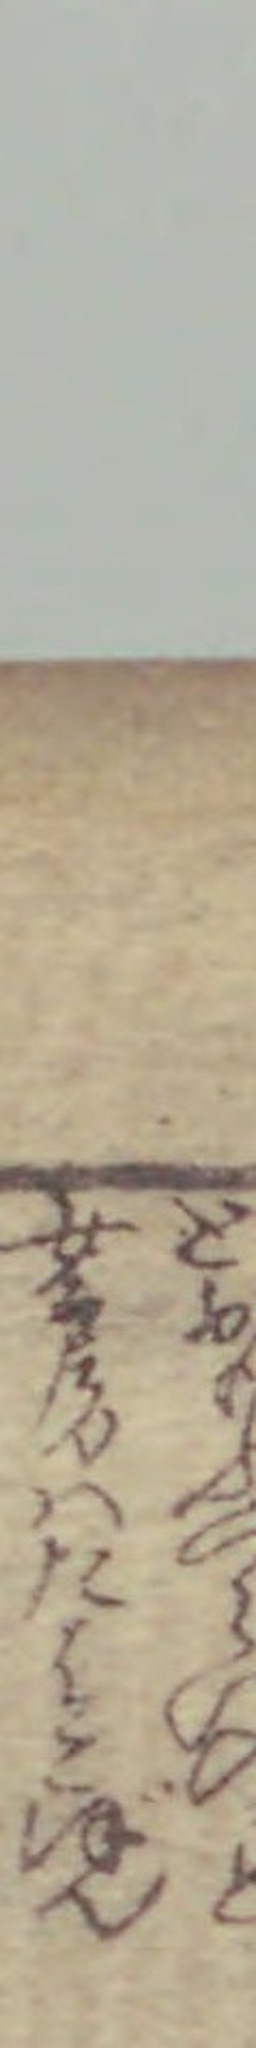女房はたはこぼん
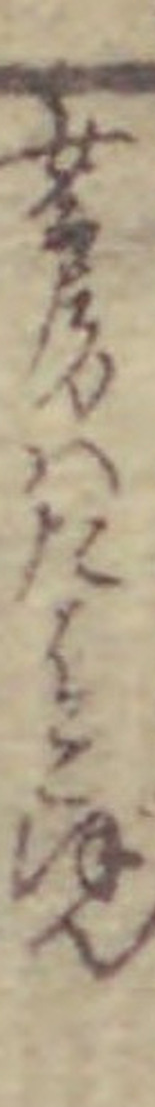女房はたはこぼん
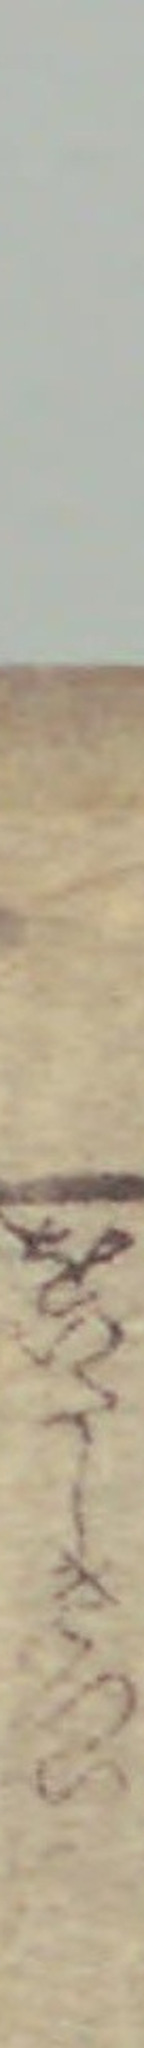をいたしきつい
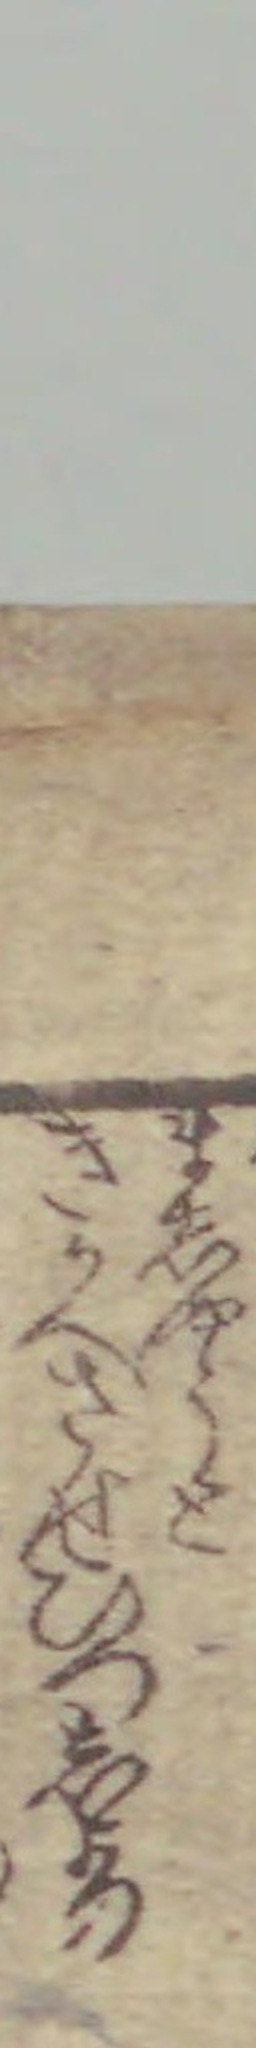きかへさせひつしより
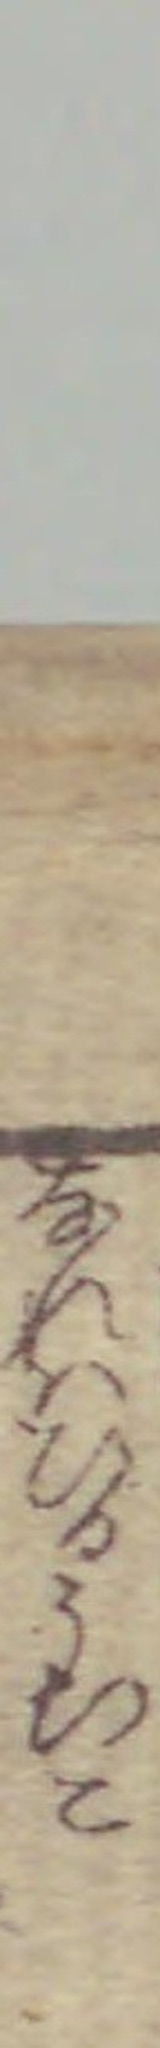なれはひるうちこ
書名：思事夢濃枕 3巻
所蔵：国立国会図書館 National Diet Library, JAPAN
